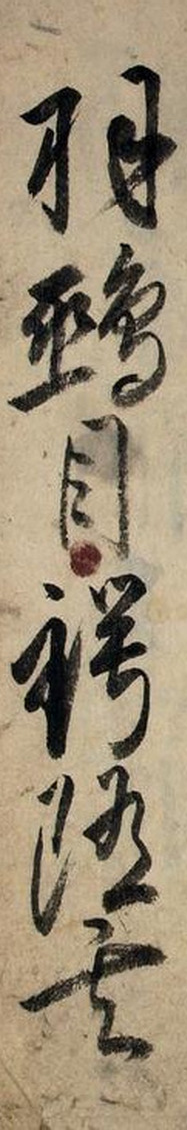羽鵐目鍔随其

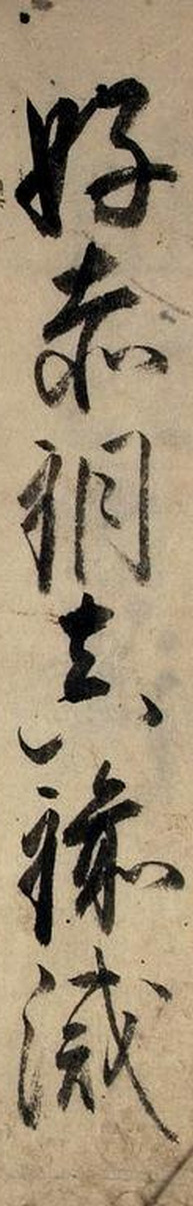好赤銅真鍮減
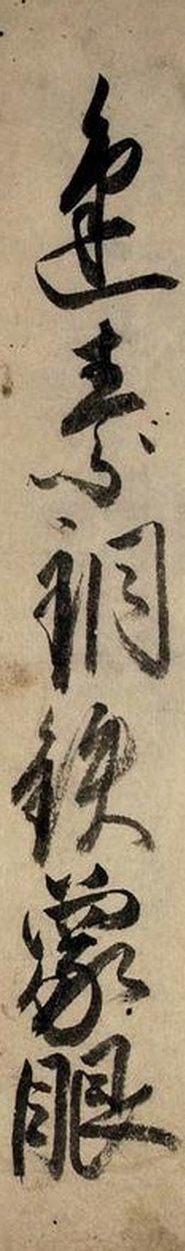金素銅鉄象眼
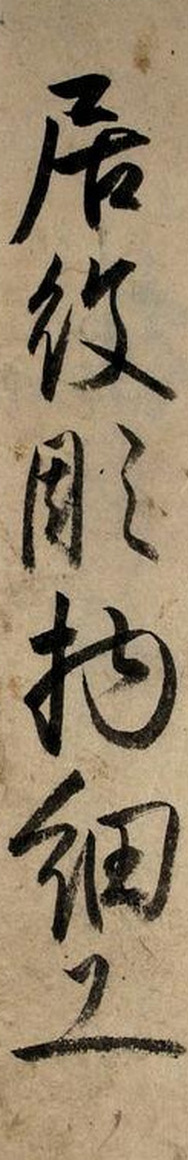居紋彫物細工
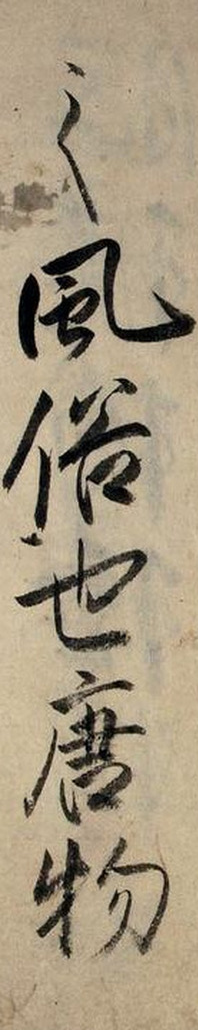之風俗也唐物
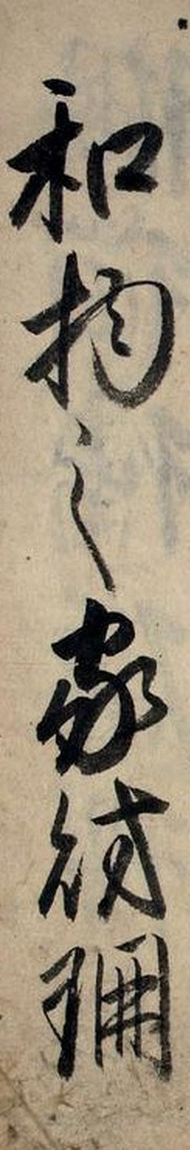和物之家財珊

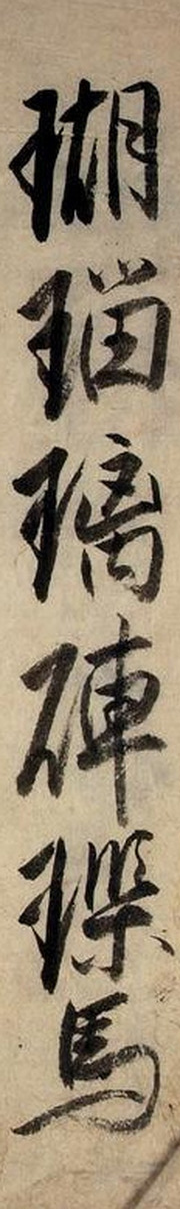瑚瑠璃硨磲馬
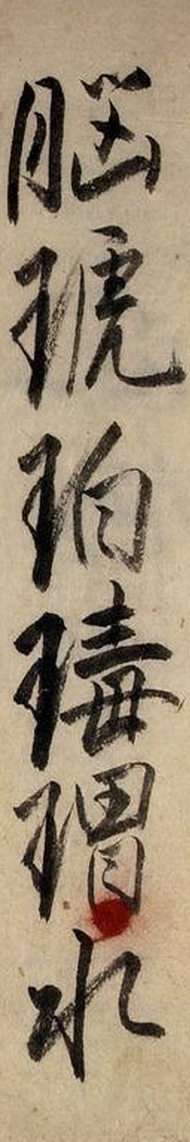脳琥珀瑇瑁水
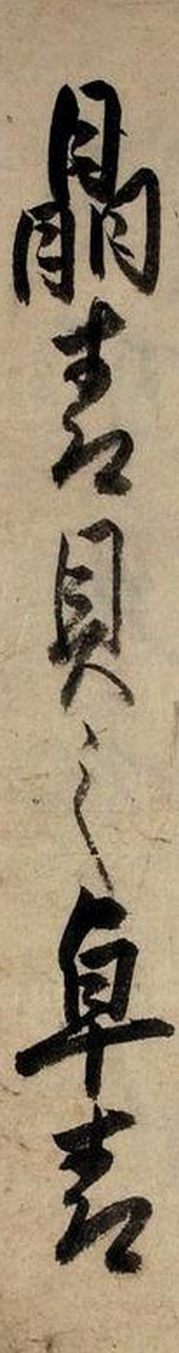晶青貝之卓青
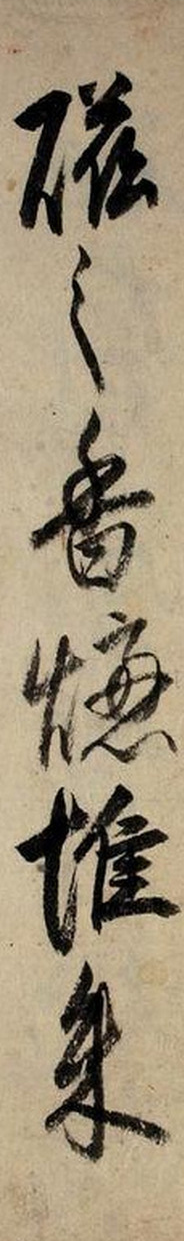磁之香爐堆朱
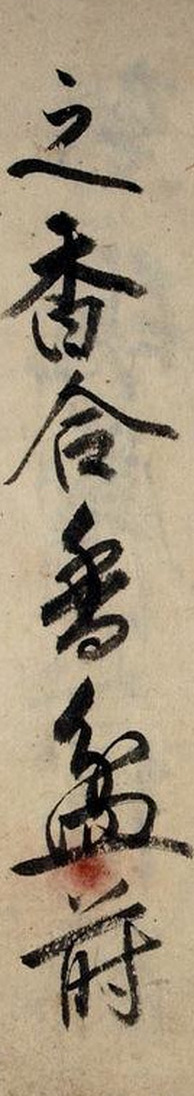之香合香盆蒔
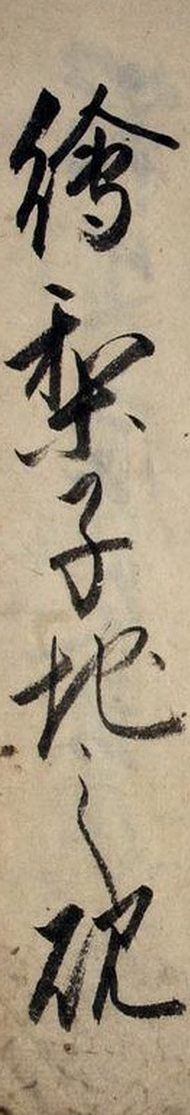絵梨子地之硯

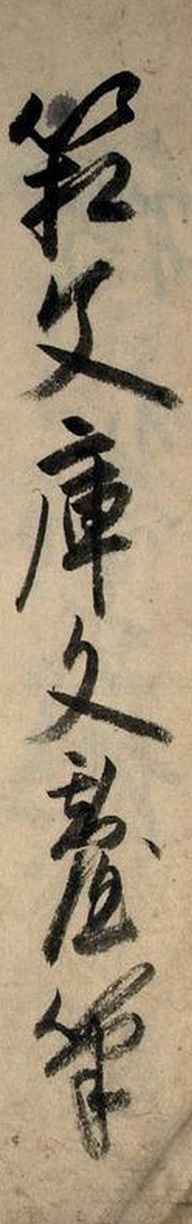箱文庫文台筆
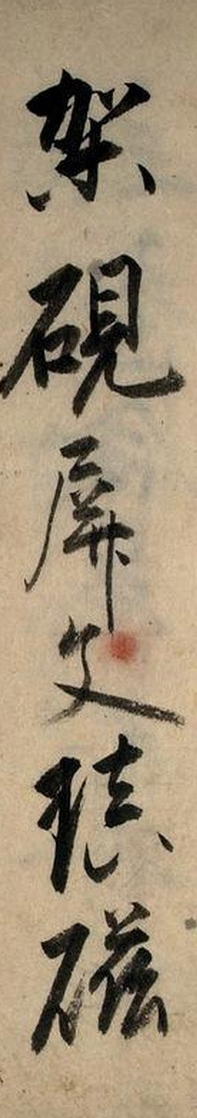架硯屏文鎮磁
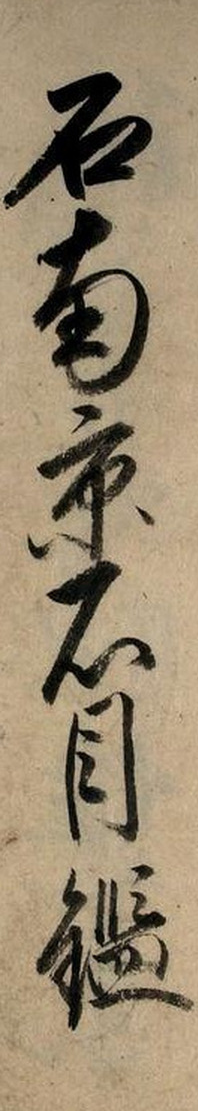石南京石目鑑
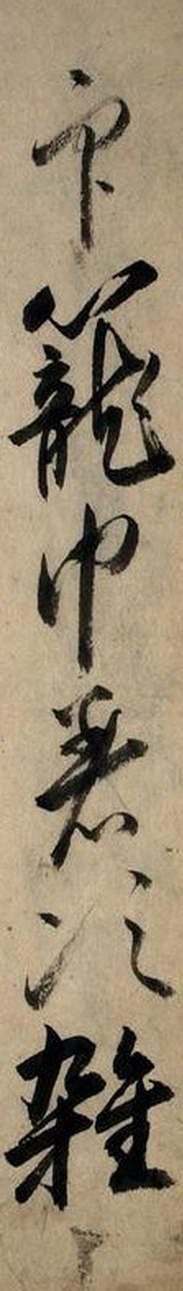印籠巾着次雑
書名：商売往来（往来物、手習手本）
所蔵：福井県文書館 Fukui Prefectural Archives
